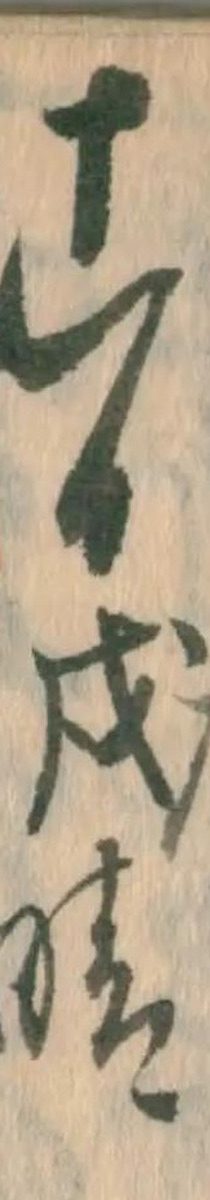十八日戌晴
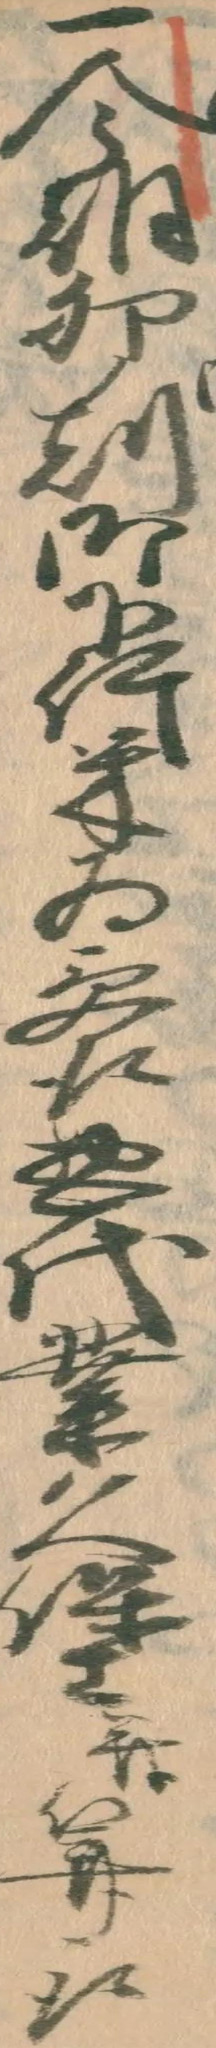一今朝卯ノ刻御下行米為受取惣代業久保士并算取
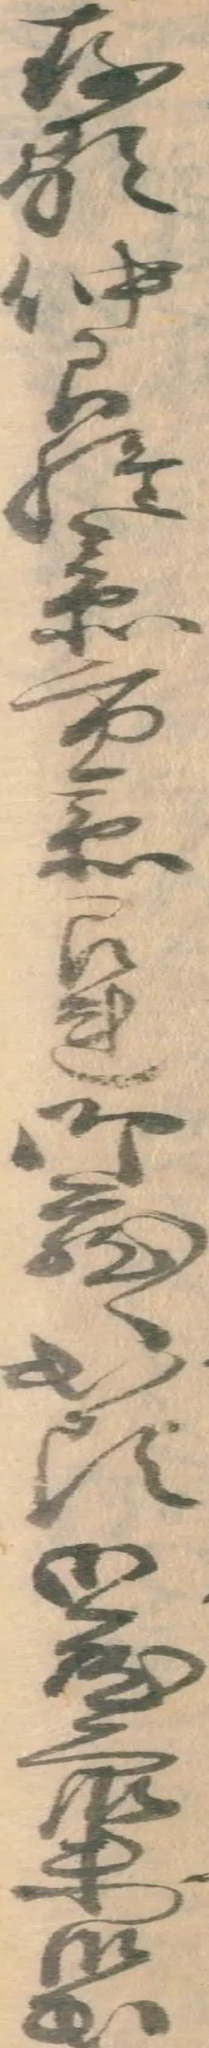存顕仲間権兵衛市兵衛召連御蔵へ出頭御蔵衆未御出
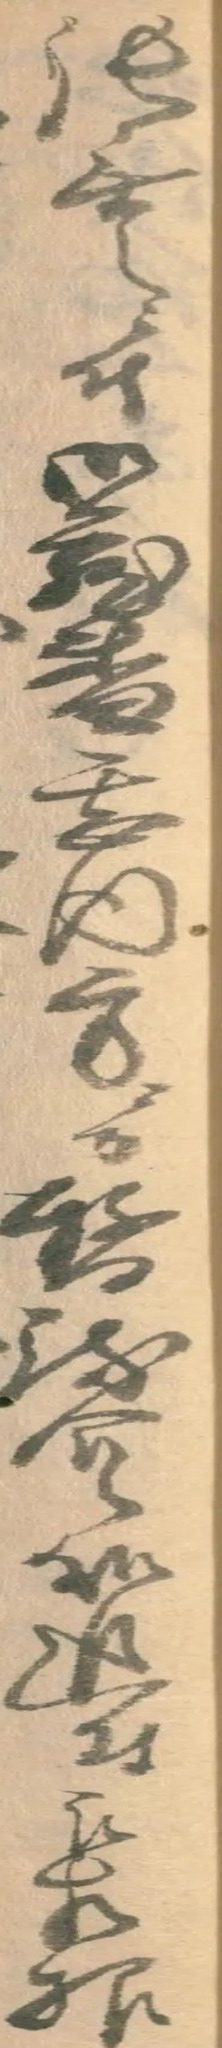張無之ニ付御蔵番甚内方ニ而暫待合候処追付被相招
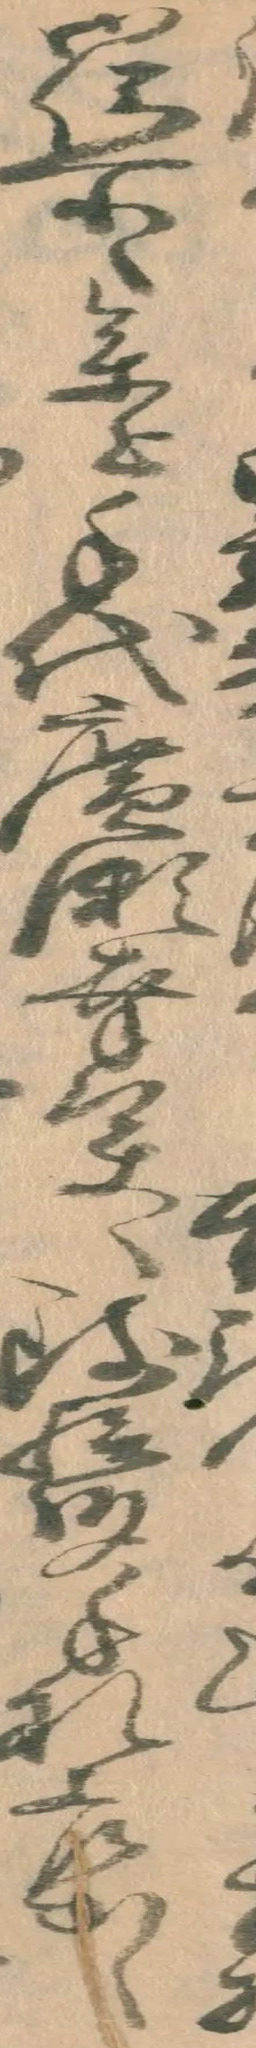御所へ参上手代広瀬幸大夫へ致挨拶手札差出候
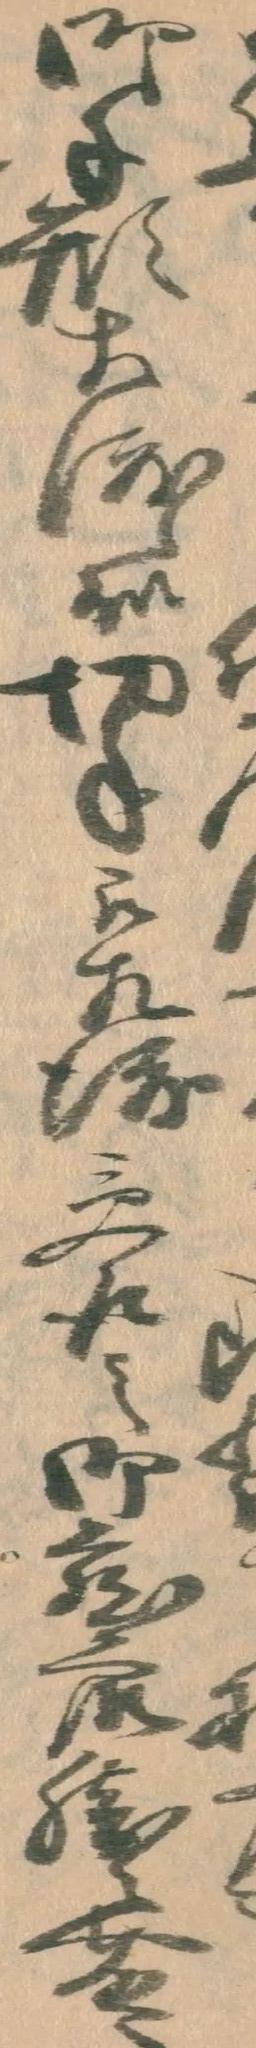御手形相渡候処切手被相渡受取之御蔵衆勝之介殿へ
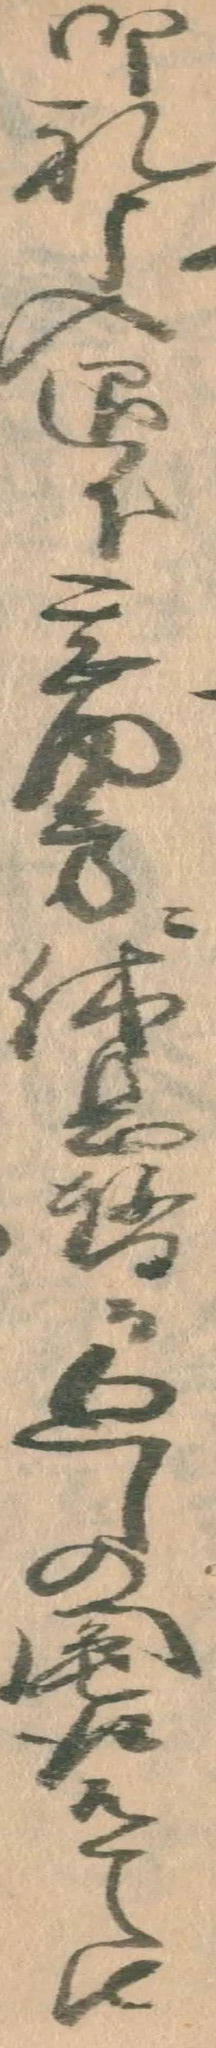御礼申入退下甚内方ニ休息暫而廻しの鬮取有之由
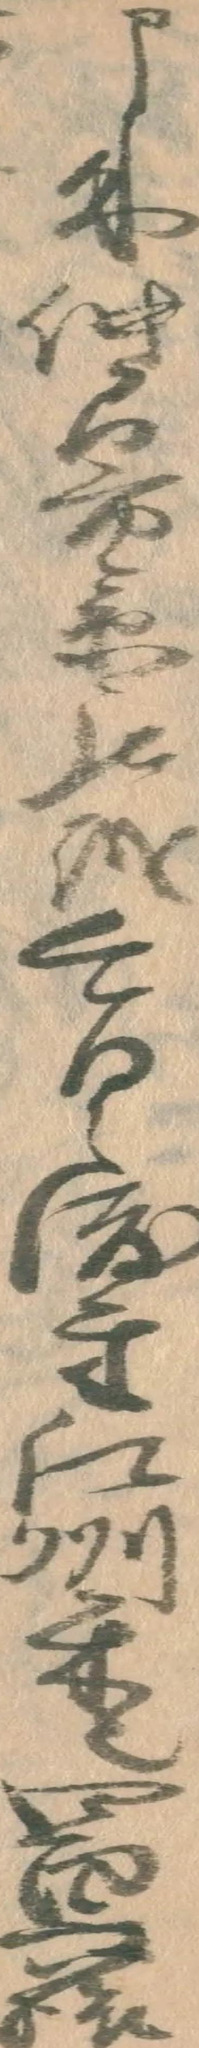申来仲間市兵衛罷越今日之渡米江州米也四百六拾
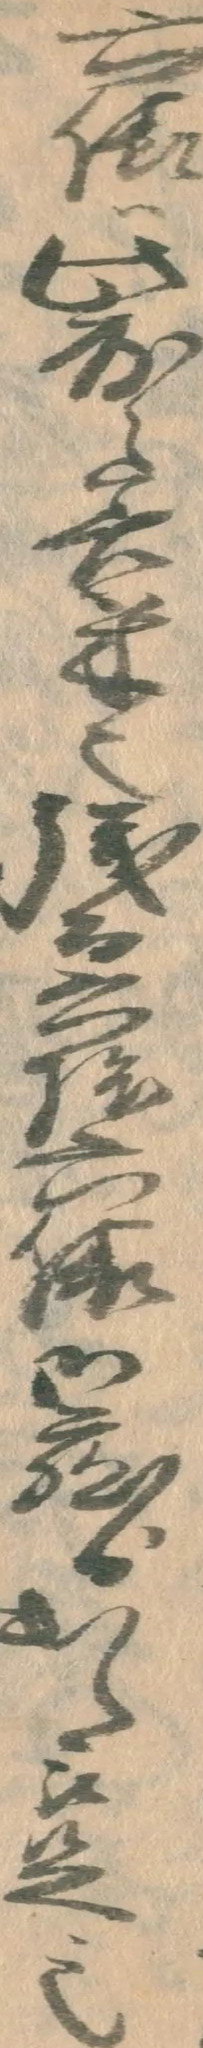六俵ハ此度之善米也残る六拾六俵御蔵ゟ出し被定也
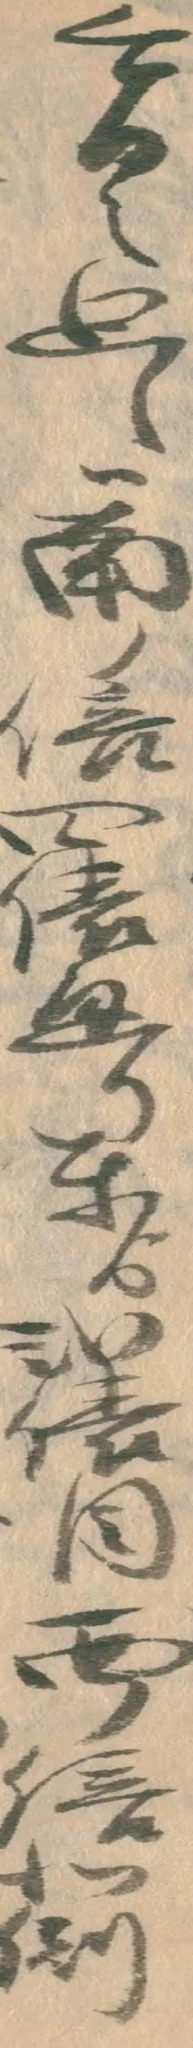今日之廻しハ南ノ倍四俵通り東ゟ弐俵目西ノ倍如例
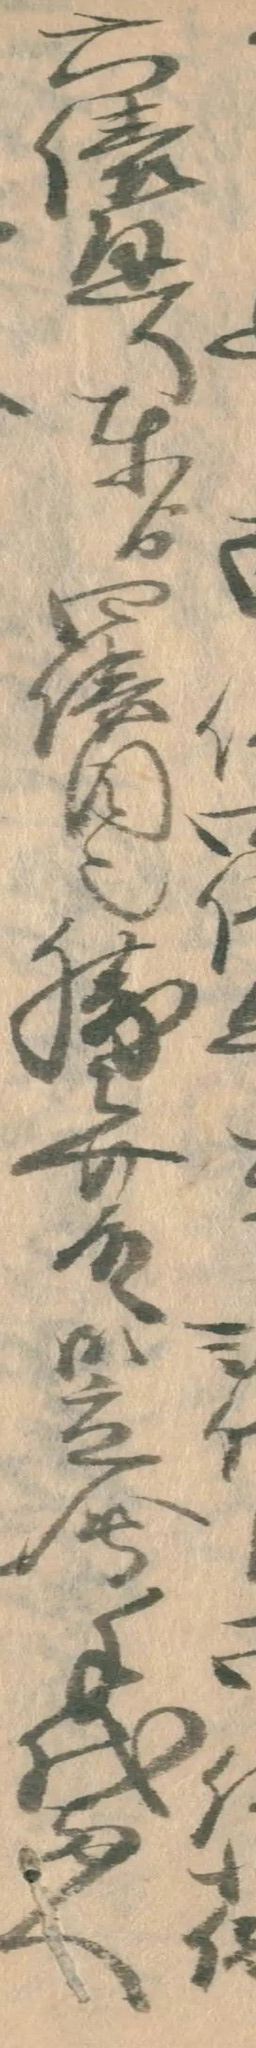六俵通り東ゟ四俵目也勝之介殿御立会手代両人
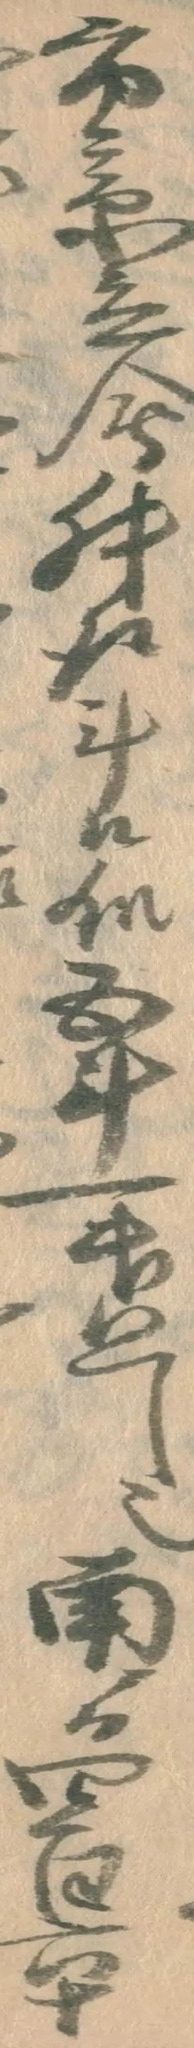市兵衛立会升取計候処五斗一升廻し也南ニ而四百六十
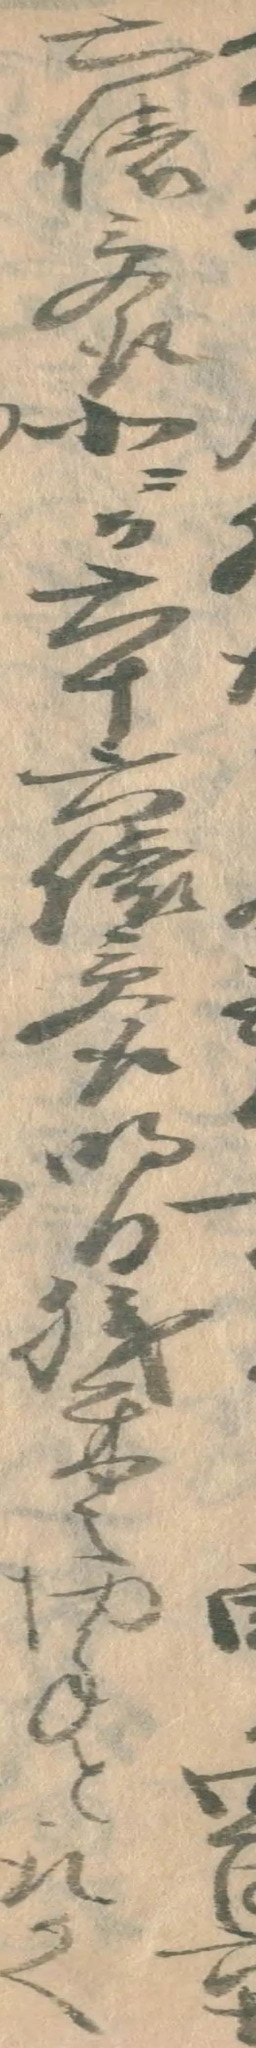六俵受取北ニ而六十六俵受取明日残米之切手と取かへ
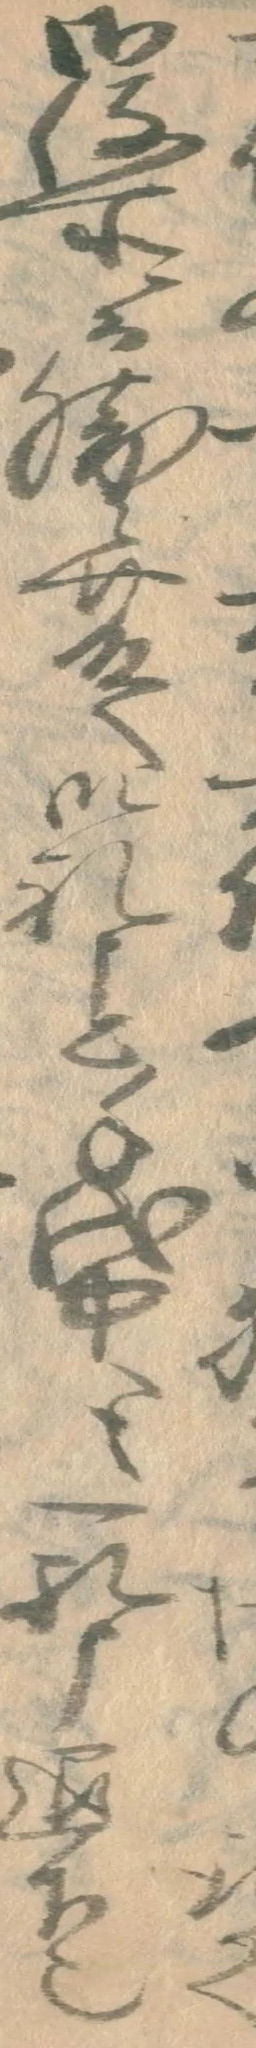御役所ニ而勝手介殿へ御礼申上手代中へも一礼申退下也
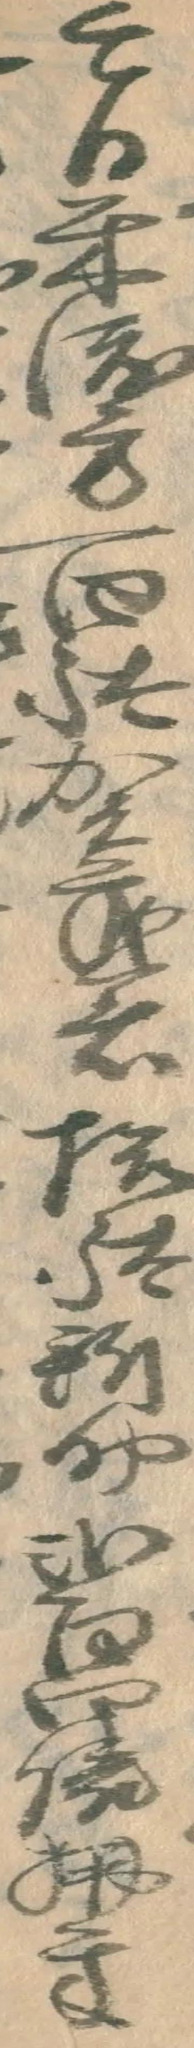今日米渡方百駄賀茂着拾駄新助弐百四俵払米
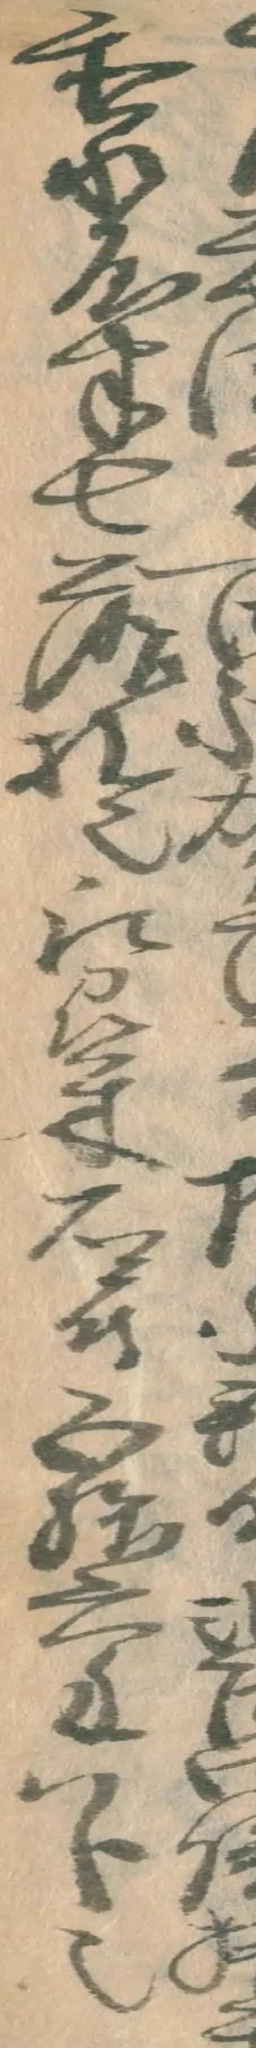和泉屋半七落札也江州米石ニ付五拾六匁八分也
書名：賀茂社記録. 第60冊
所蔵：国立国会図書館 National Diet Library, JAPAN
